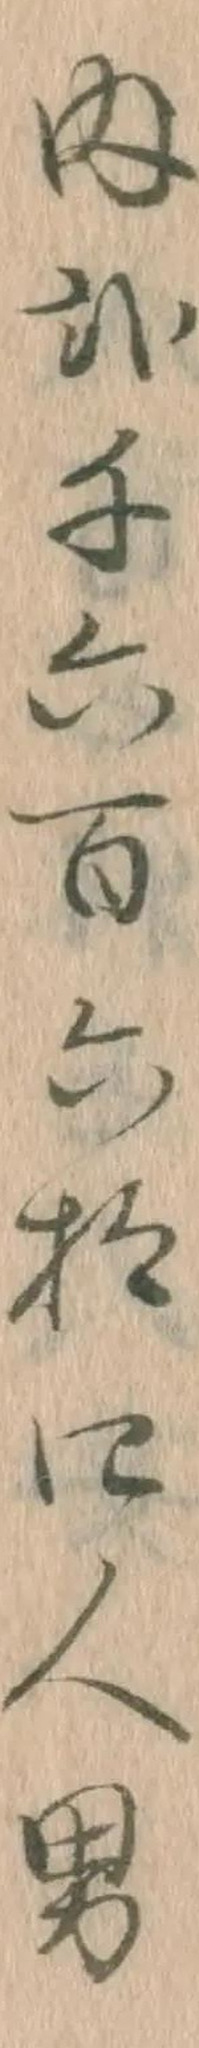内弐千六百六拾四人男
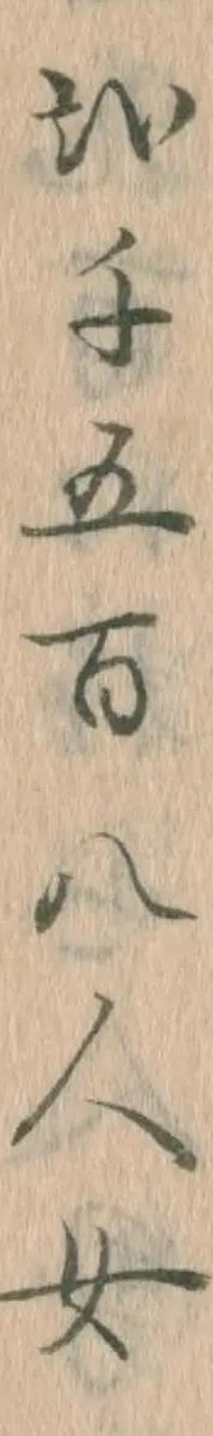弐千五百八人女
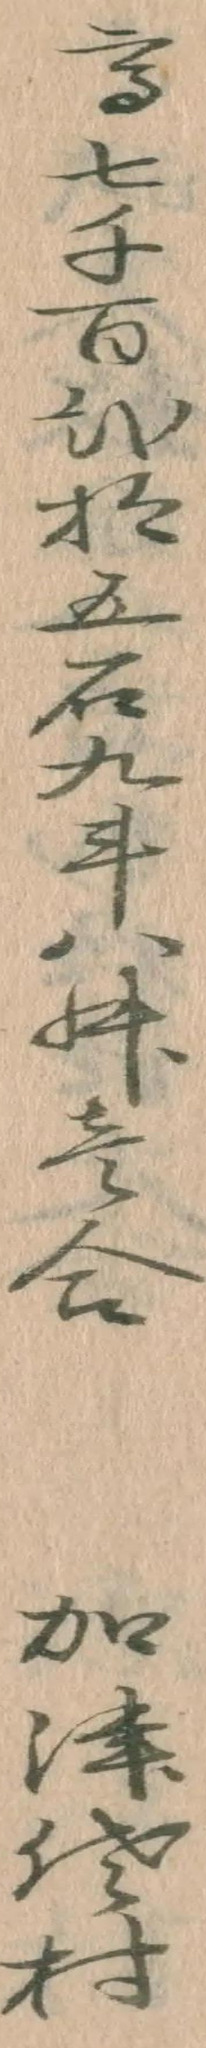高七千百弐拾五石九斗八升壱合加津佐村
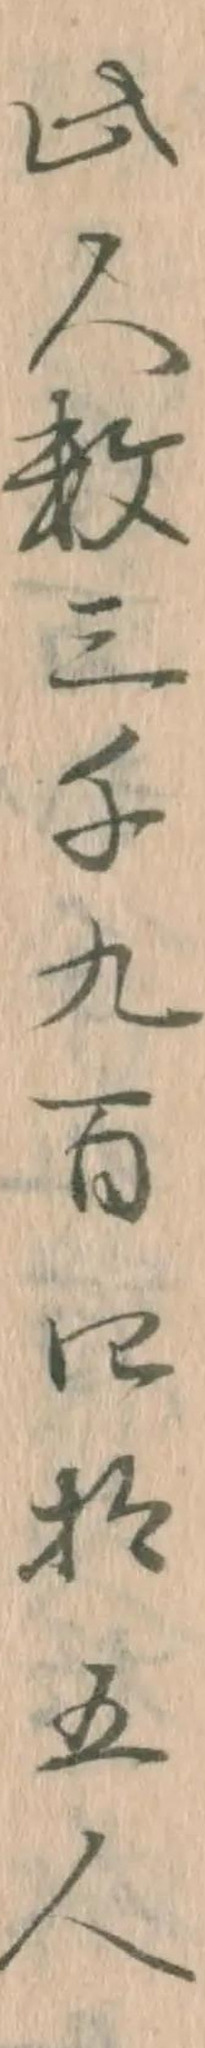此人数三千九百四拾五人
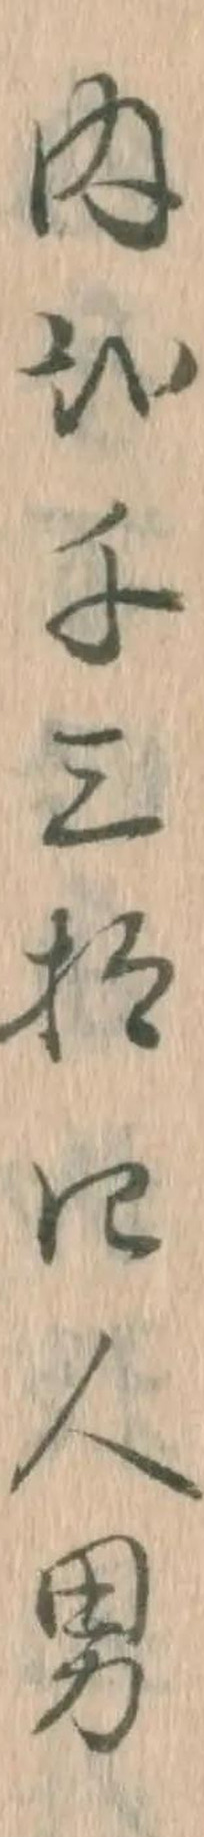内弐千三拾四人男
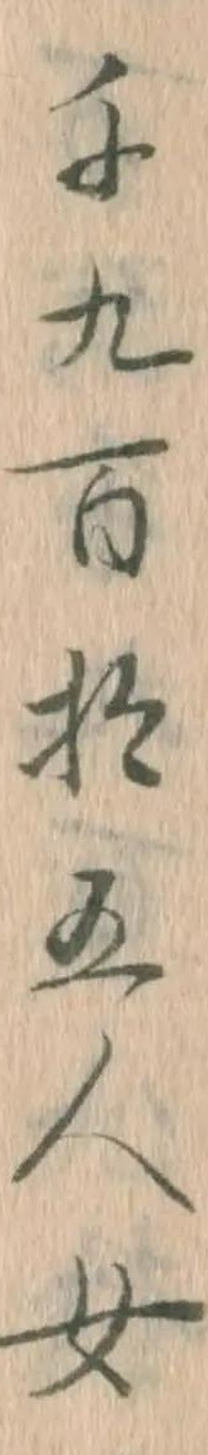千九百拾五人女
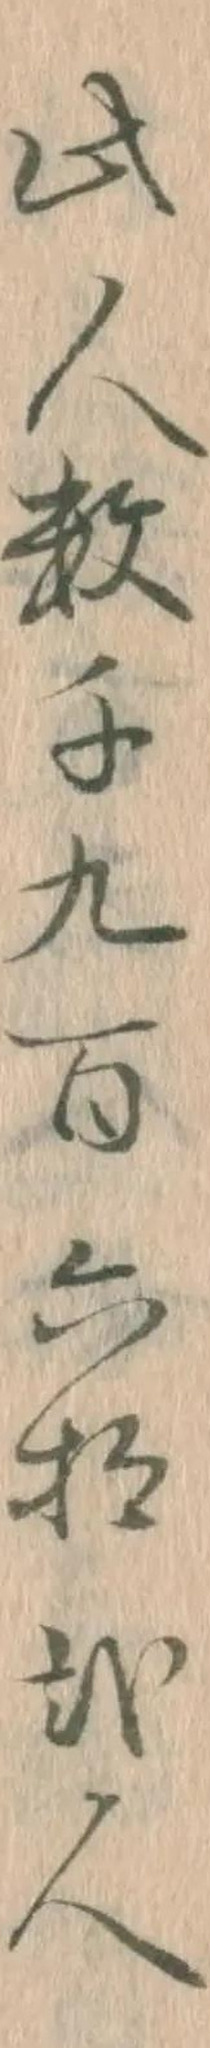此人数千九百六拾弐人
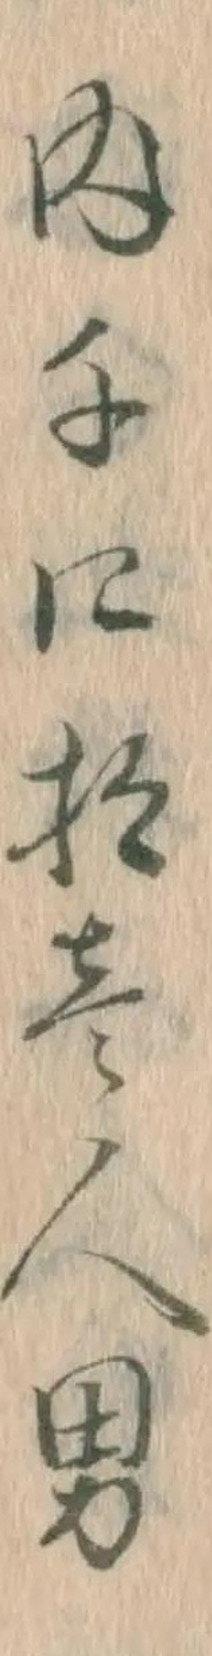内千四拾壱人男
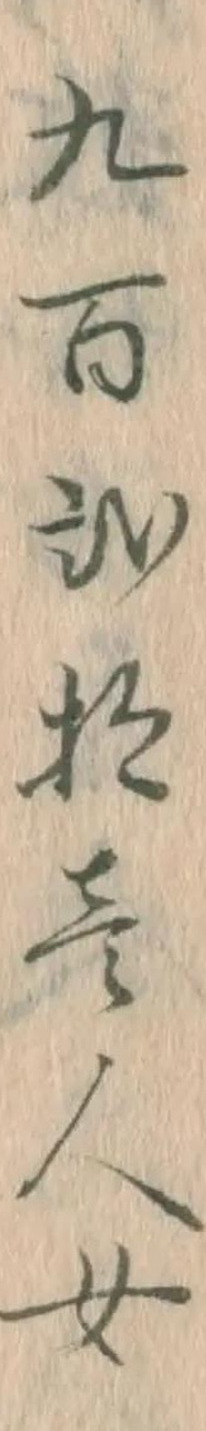九百弐拾壱人女
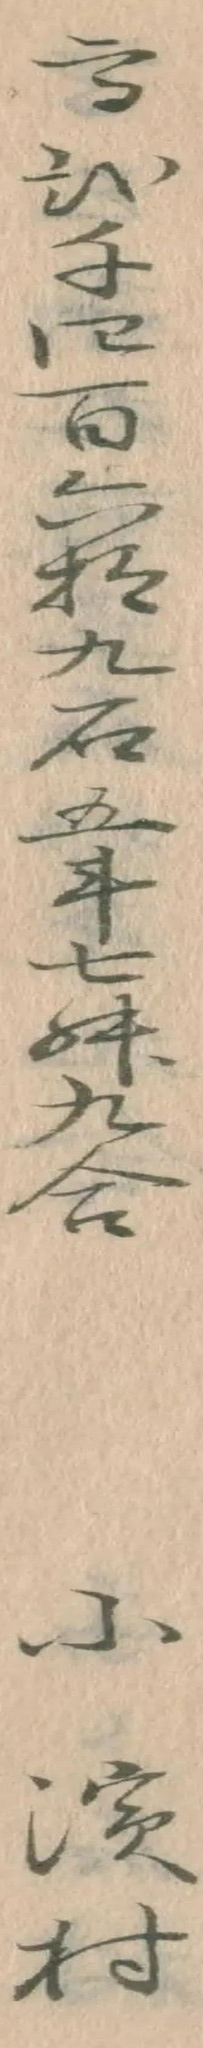高弐千四百六拾九石五斗七升九合小浜村
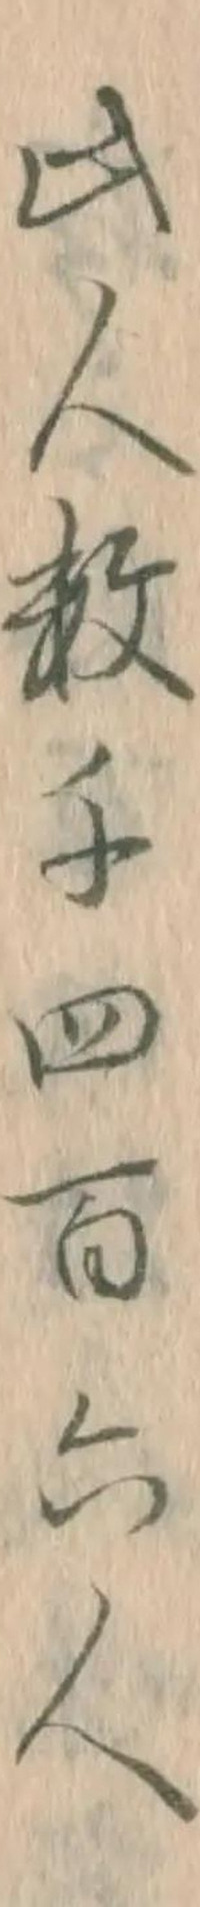此人数千四百六人
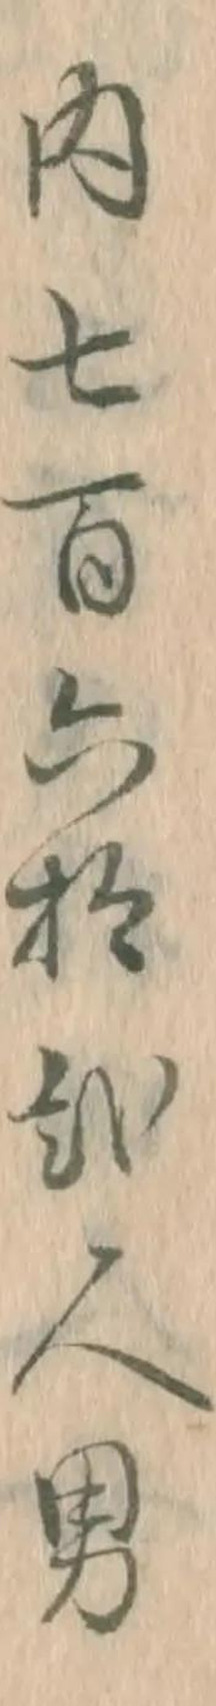内七百六拾弐人男

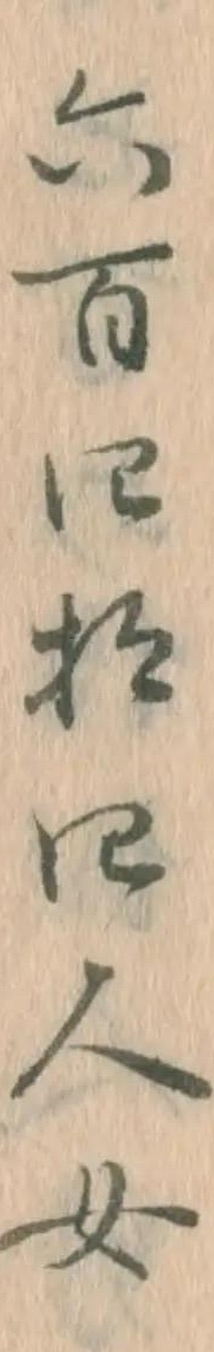六百四拾人女
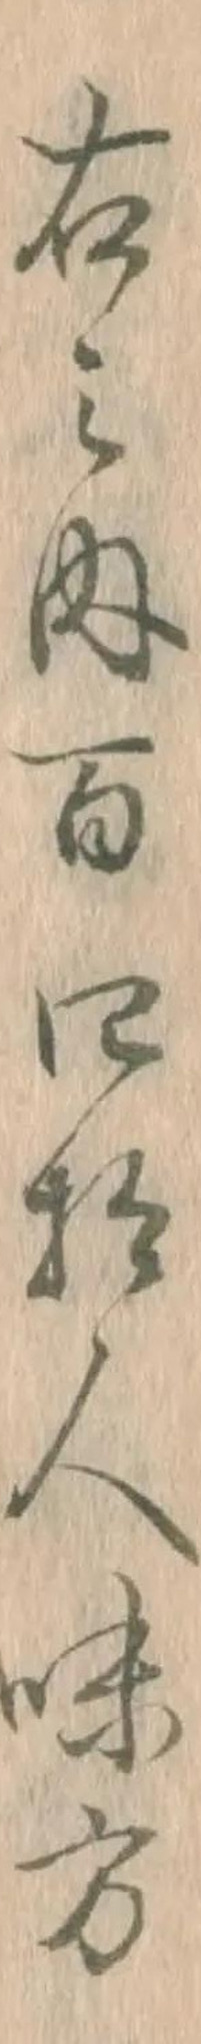右之内百四拾人味方
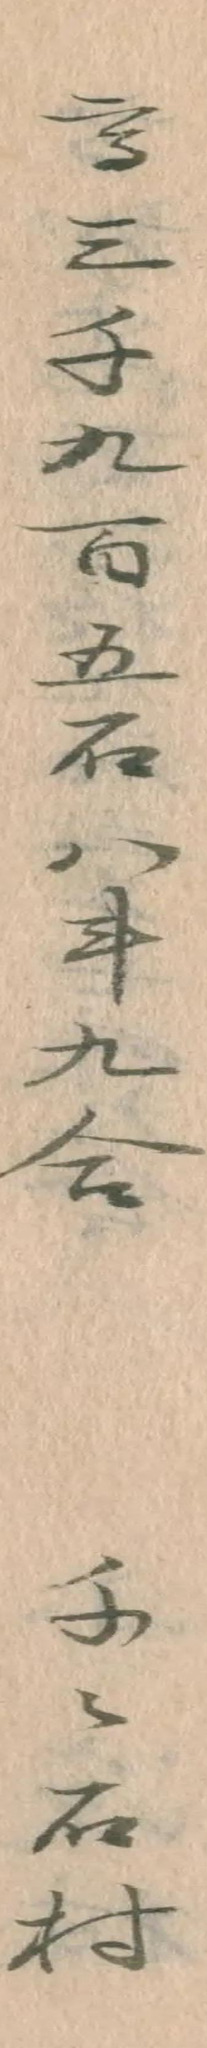高三千九百五石八斗九合千々石村
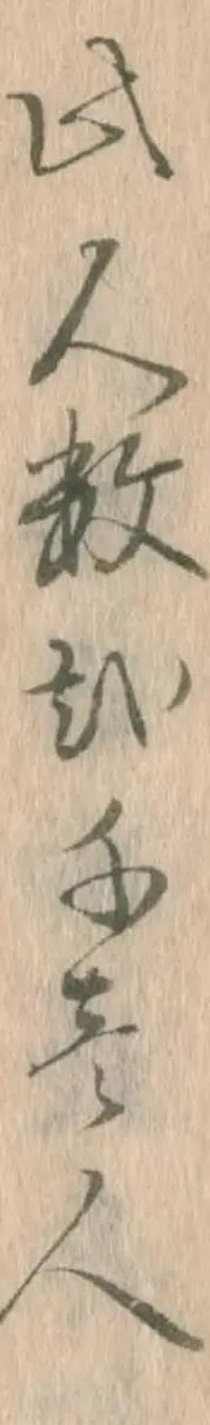此人数弐千壱人
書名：切支丹御退治記 49巻. [2]
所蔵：国立国会図書館 National Diet Library, JAPAN
